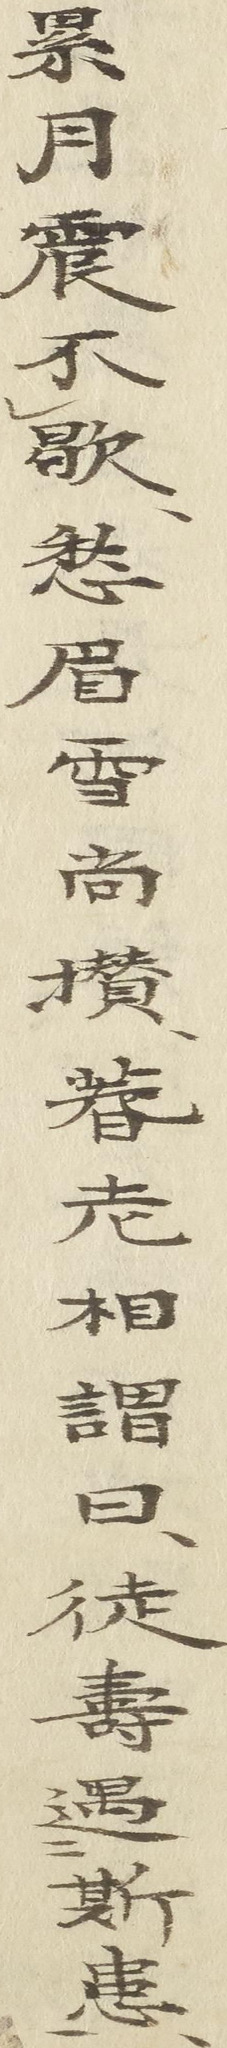累月震不歇、愁眉雪尚攅、暮老相謂曰、徒寿遇斯患、

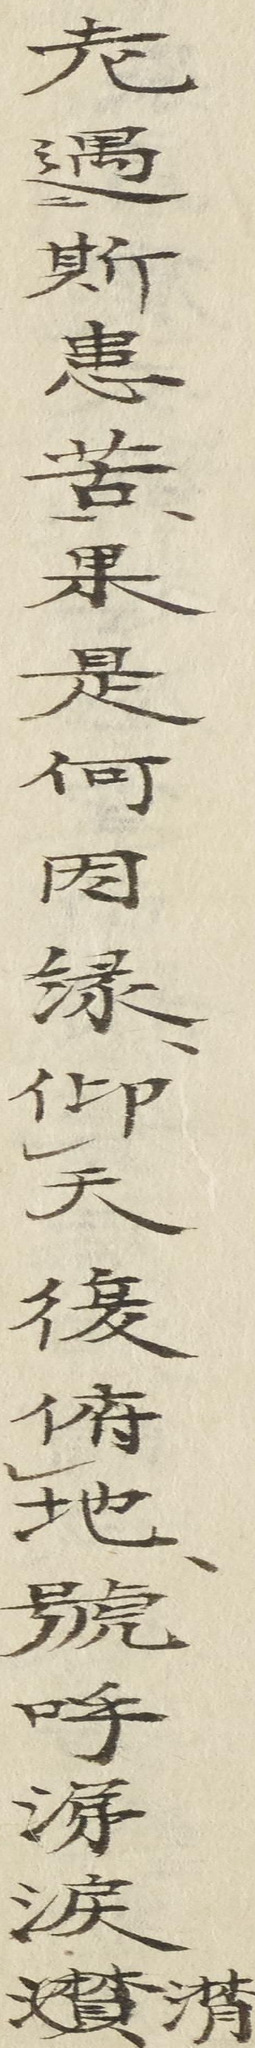老遇斯患苦、果是何因緑、仰天復俯地、號呼涕涙潸、
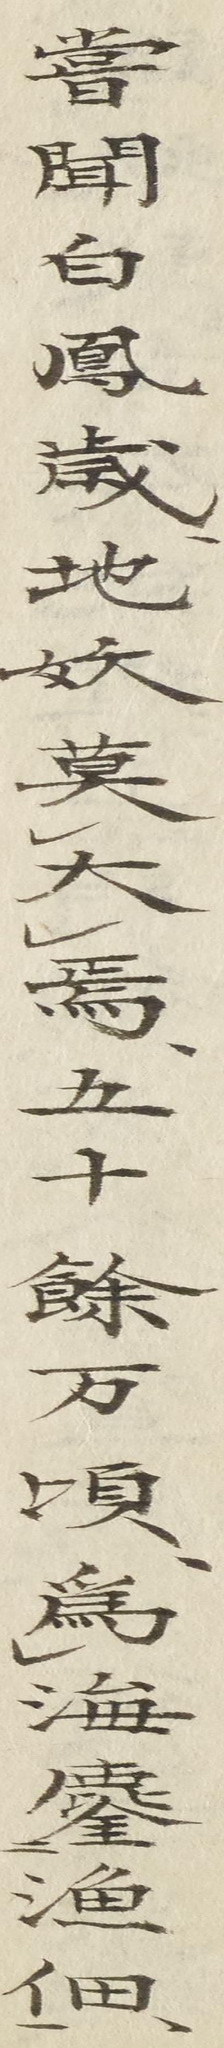嘗聞白鳳歳、地妖莫大焉、五十餘万頃、為海鏖漁佃、
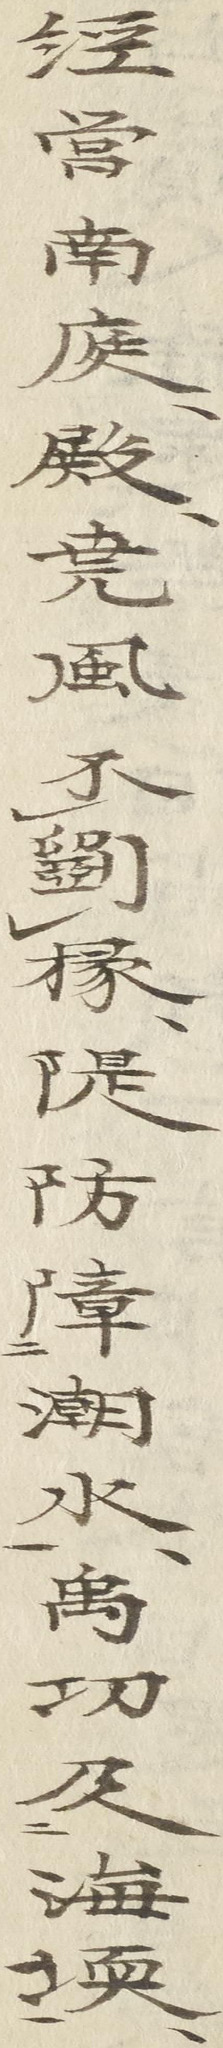徑営南庭殿、尭風不剰椽、堤防障潮水、禹功及海峡
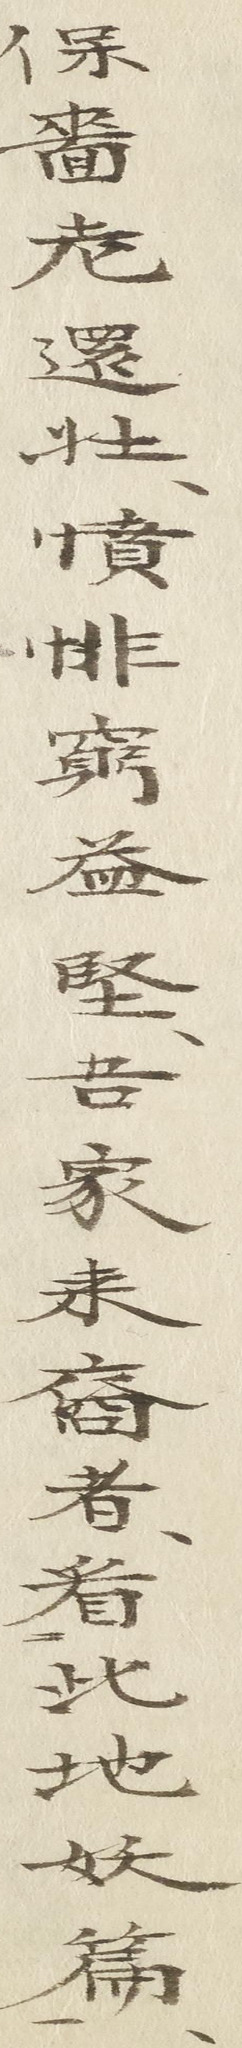保嗇老還壮、噴啡窮益堅、吾家来裔者、看此地妖篇、
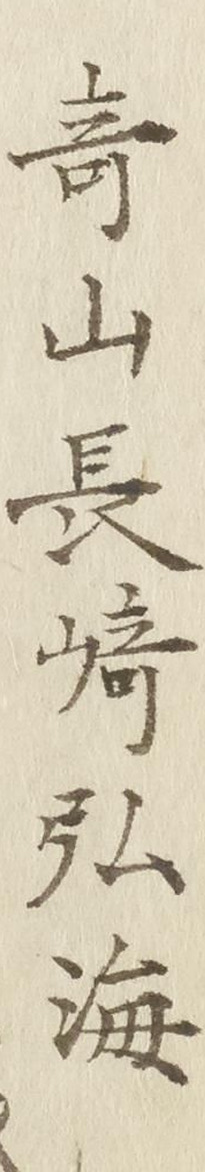奇山長崎弘海

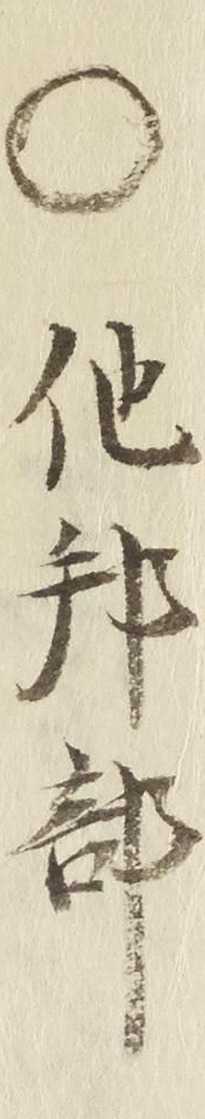◯他邦部
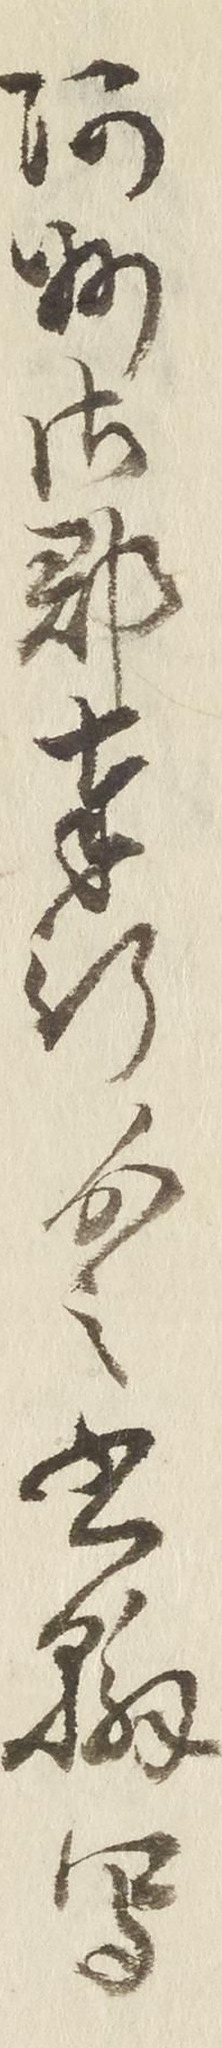阿州御郡奉行ゟ之書翰写
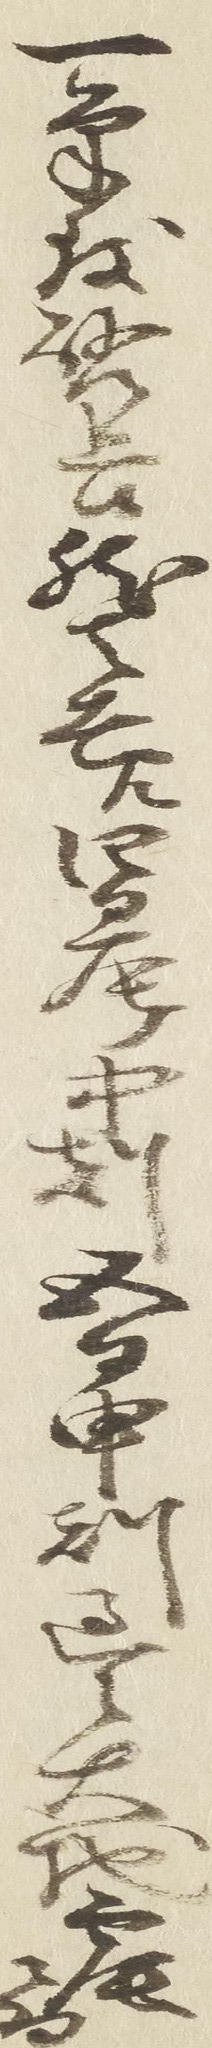一筆致啓上候然ば去四日辰之中刻五日申刻過之大地震二而
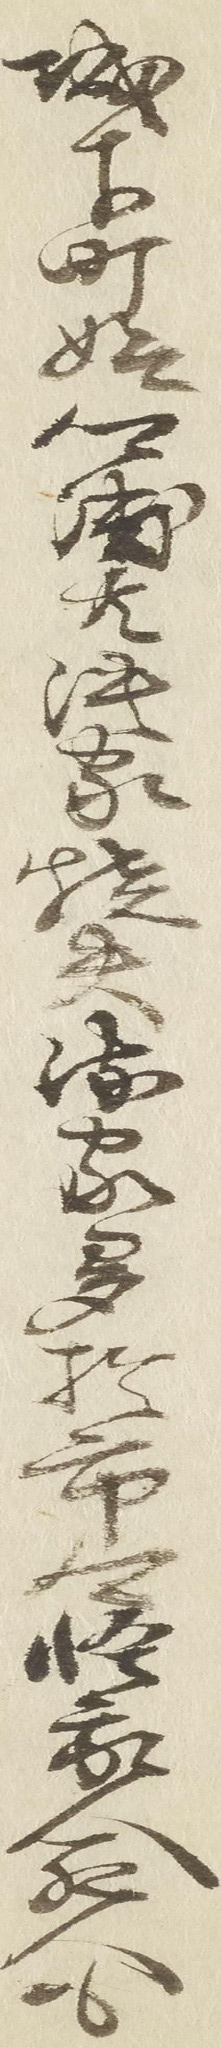城下町始郷浦共潰家焼失流家多於市郷怪我人死人も
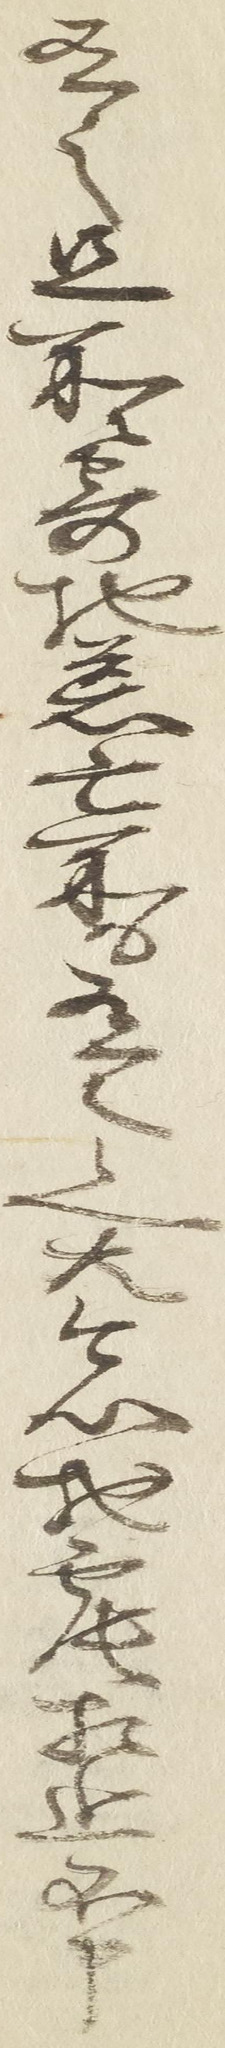有之且所々寄知流荒亡所も有之候へ共今以地震仕止不申
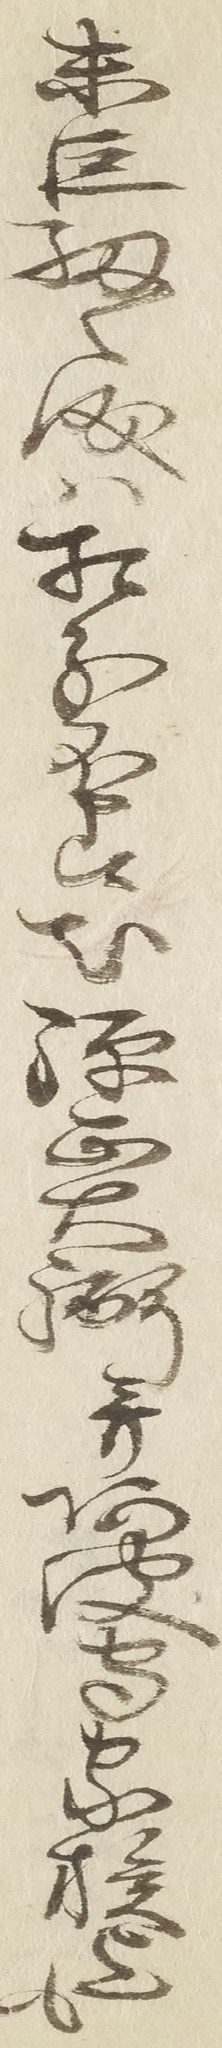未巨細之儀は相分不申候弾正大弼并阿波守家族迄も
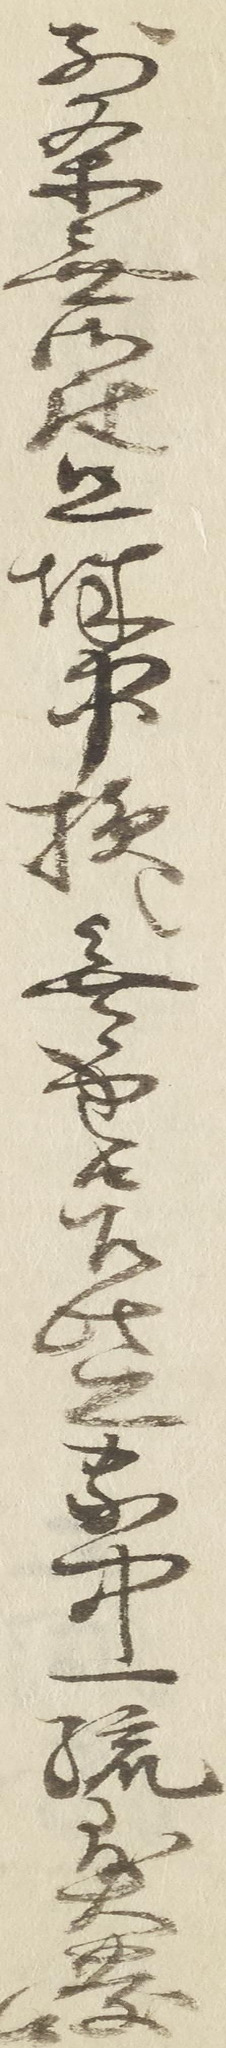別条無御座且城中損し無御座候乍此上家中一統致大慶候
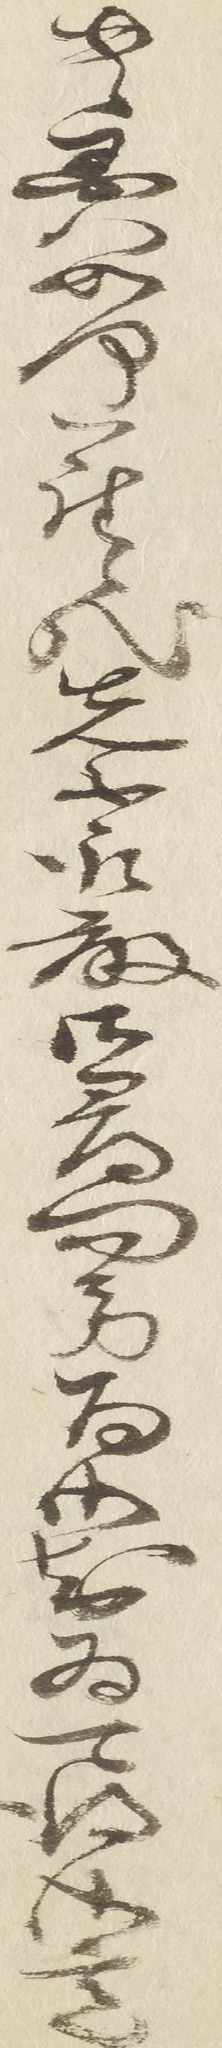貴国は如何御座候哉先不取敢御尋向旁為御知為可得御意
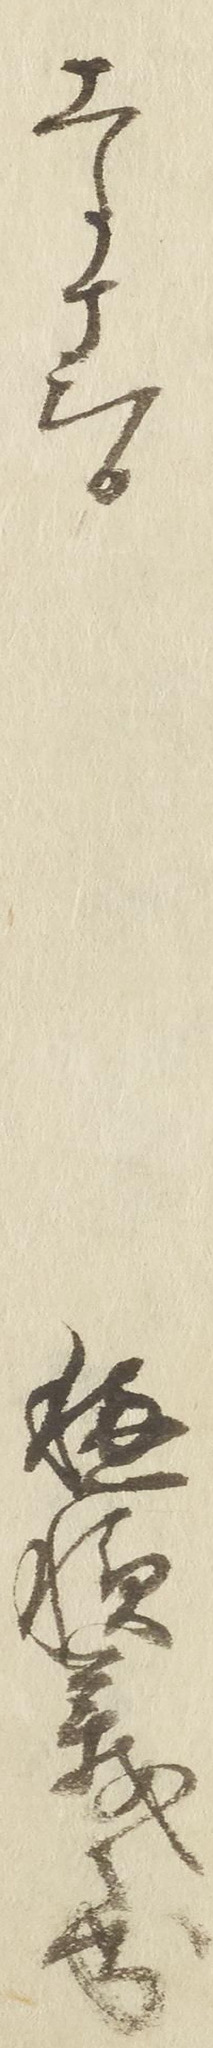十一月十三日穂積義房

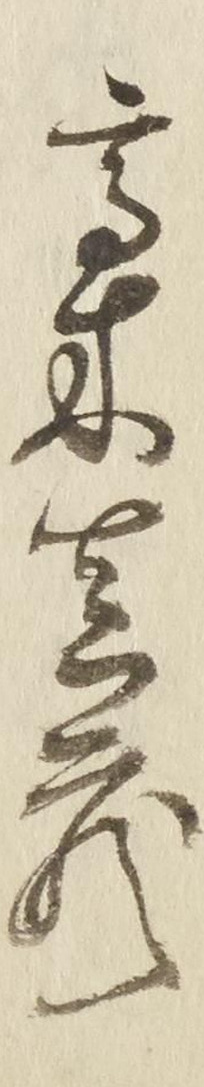高木真蔵
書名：地震記　下
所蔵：東京大学地震研究所図書室 Earthquake Research Institute Library, The University of Tokyo, JAPAN
